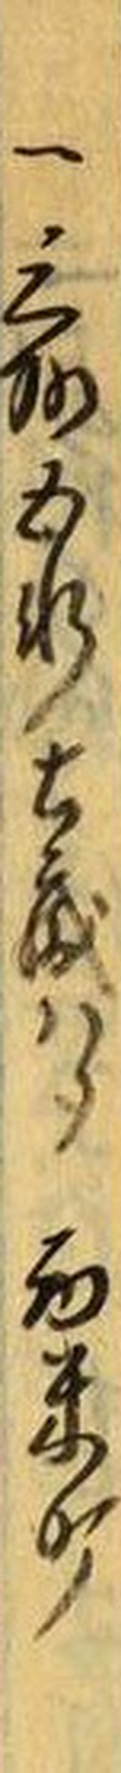一三拾五軒土蔵八ッ西米町
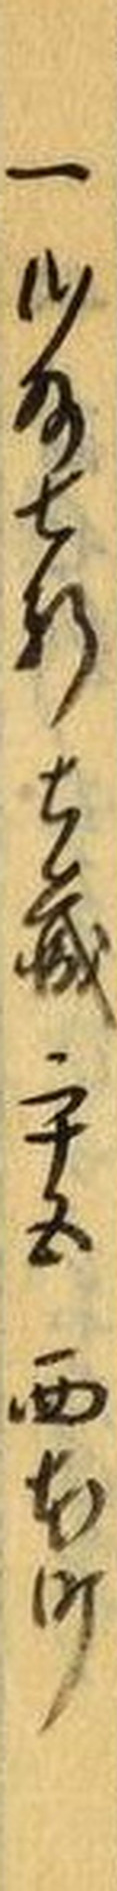一弐拾七軒土蔵二十五西本町
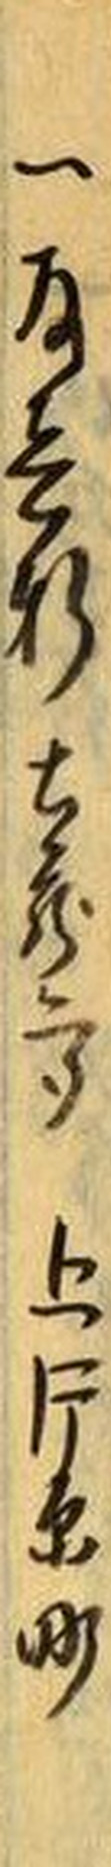一拾壱軒土蔵二ッ上片原町
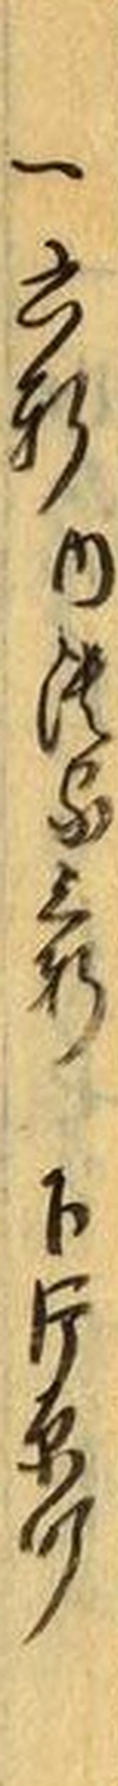一六軒内潰家三軒下片原町

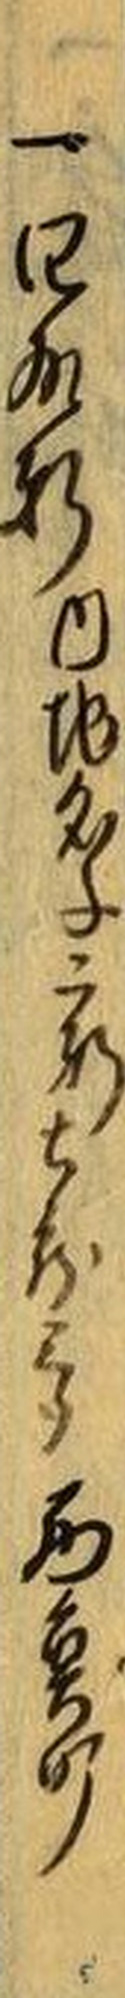一四拾軒内地名子二軒土蔵三ッ西魚町
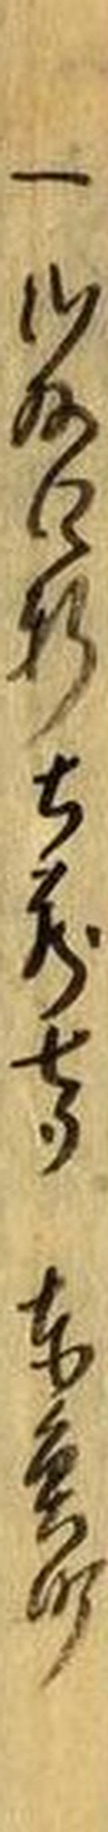一弐拾四軒土蔵七ッ本魚町
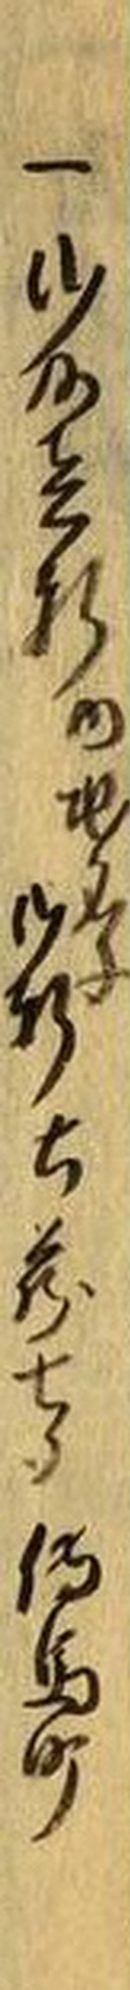一弐拾壱軒内地名子弐軒土蔵七ッ伝馬町
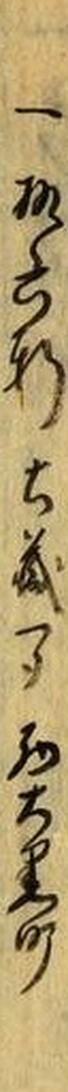一拾六軒土蔵一ッ西大黒町
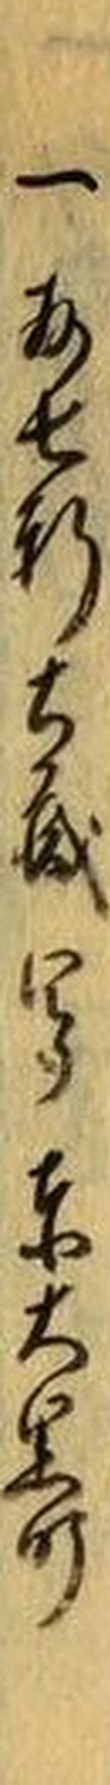一拾七軒土蔵四ッ東大黒町
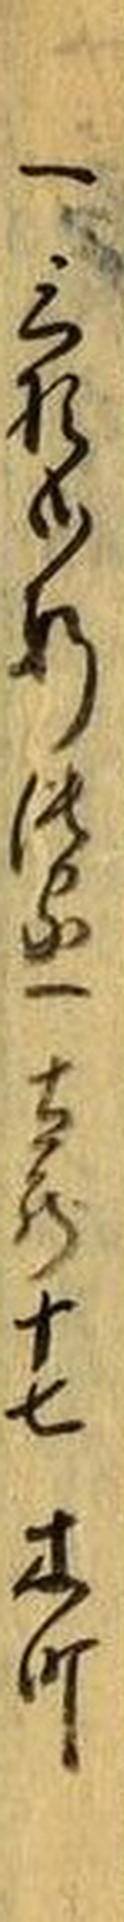一三拾弐軒潰家一土蔵十七木町
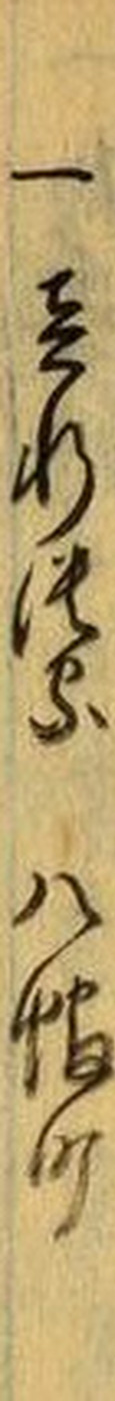一壱軒潰家八幡町
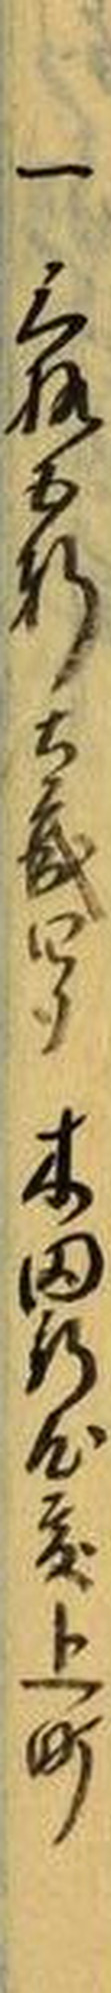一三拾五軒土蔵四ッ木田新屋敷上町
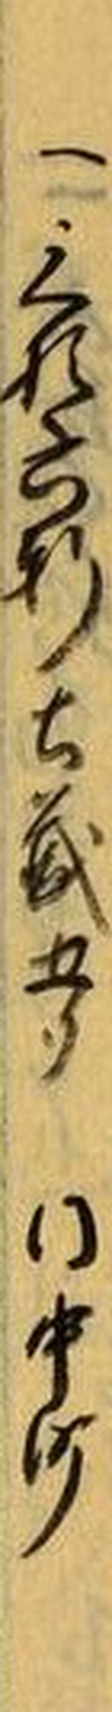一三拾六軒土蔵五ッ同中町
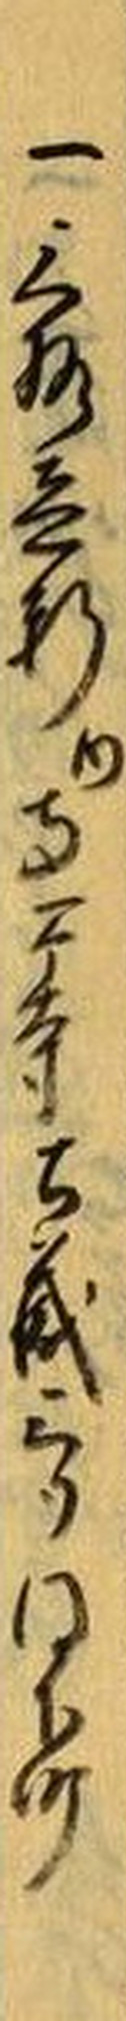一三拾壱軒内寺一ヶ寺土蔵三ッ同下町
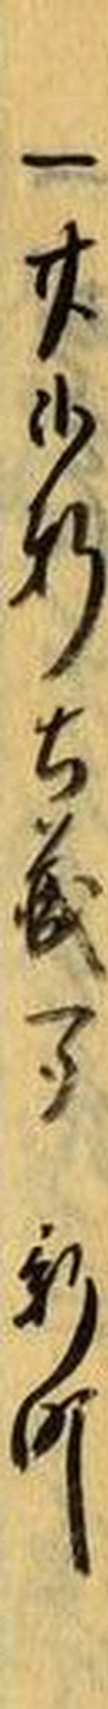一廿弐軒土蔵一ッ新町
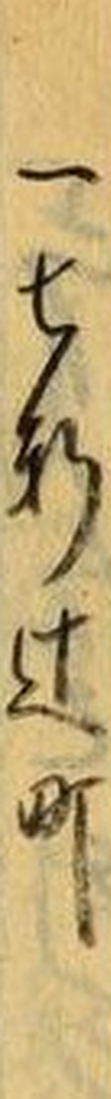一七軒辻町
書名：温古集 五巻
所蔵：福井県文書館 Fukui Prefectural Archives
